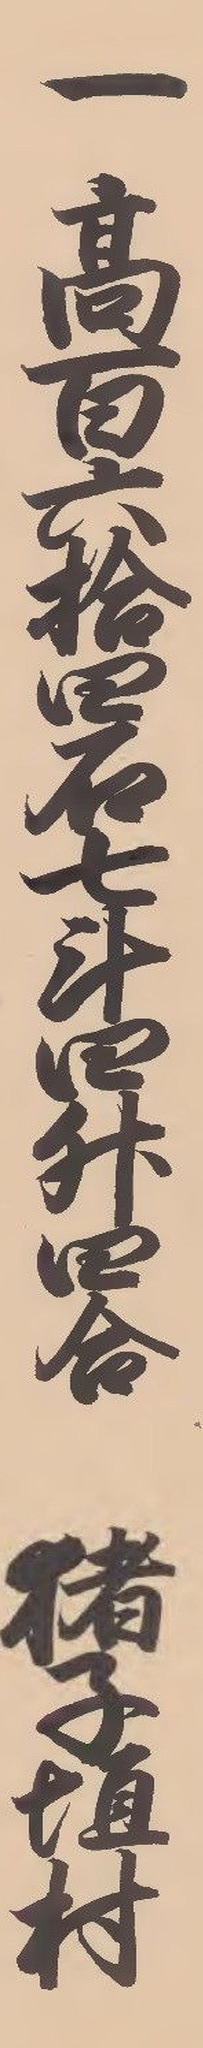一高百六拾四石七斗四升四合猪子垣村
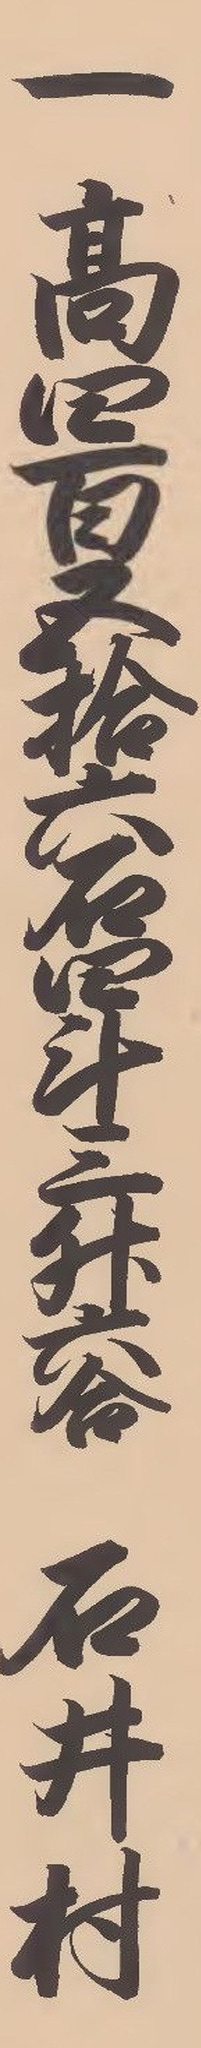一高四百五拾六石四斗三升六合石井村
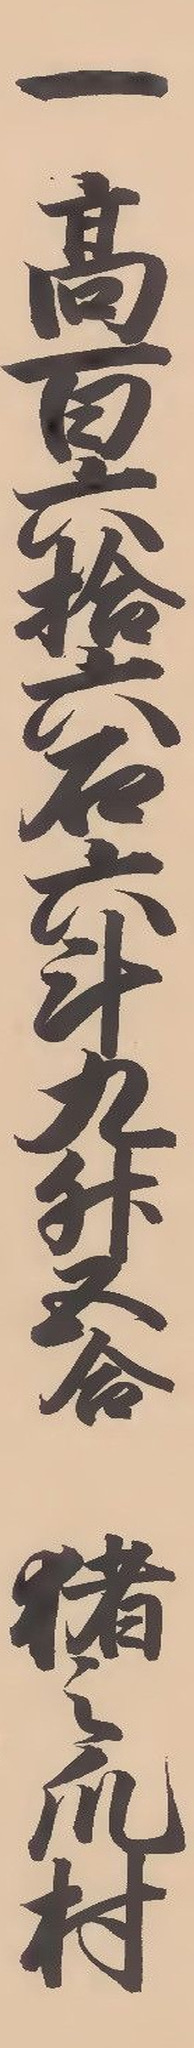一高百六拾六石六斗九升五合猪之爪村
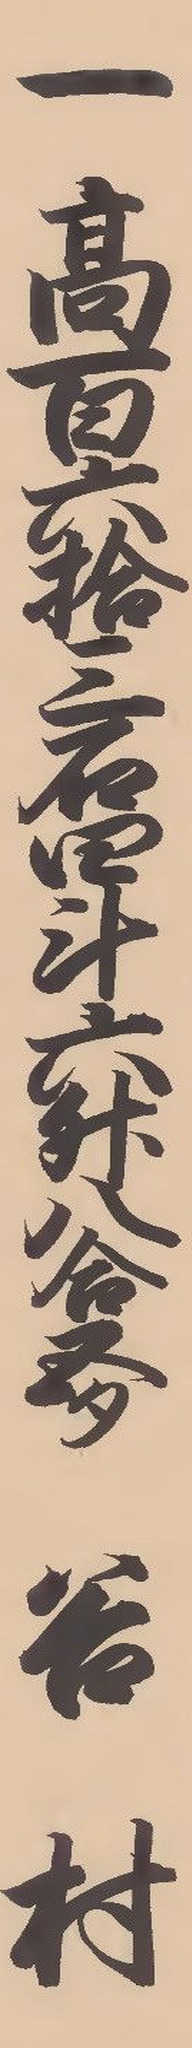一高百六拾三石四斗六升八合五勺谷村
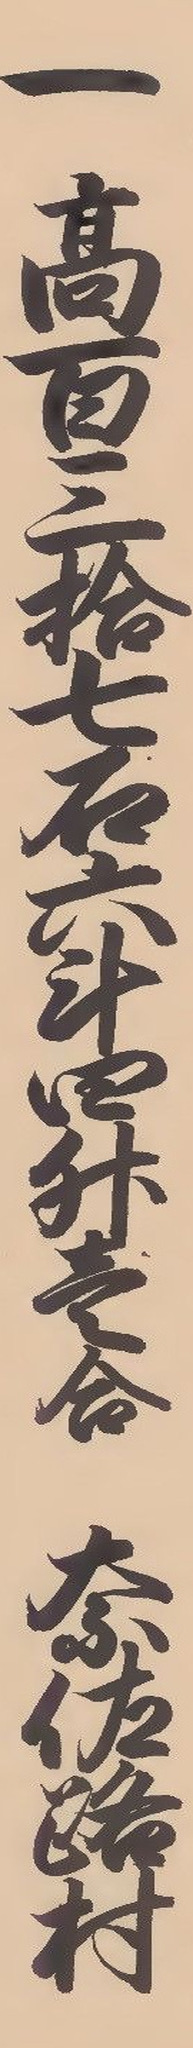一高百三拾七石六斗四升壱合奈佐路村

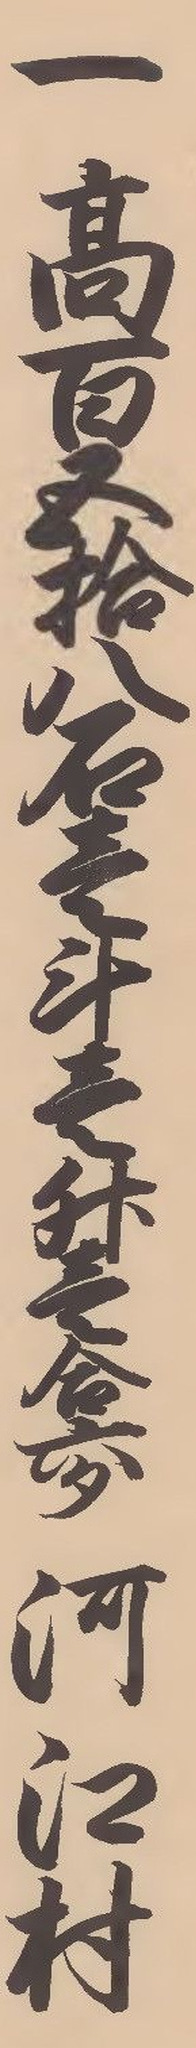一高百五拾八石壱斗壱升壱合六勺河江村
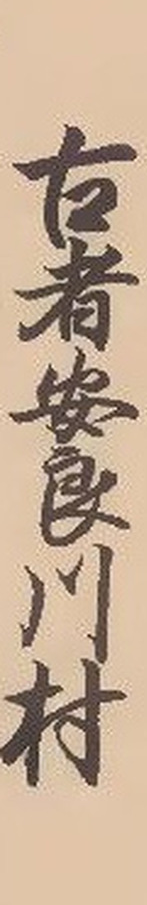古者安良川村
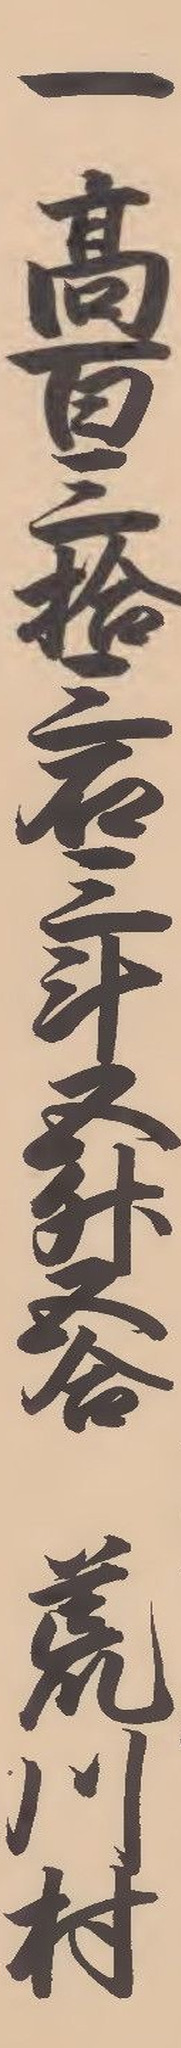一高百三拾三石三斗五升五合荒川村
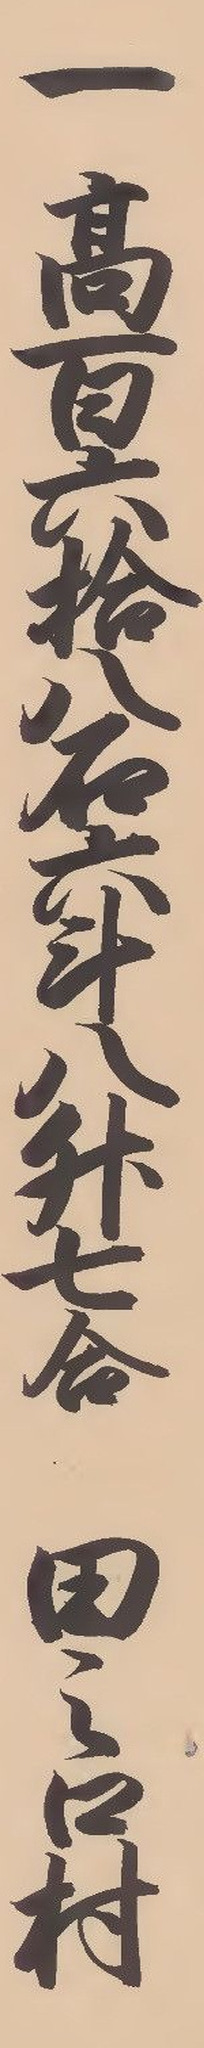一高百六拾八石六斗八升七合田之口村
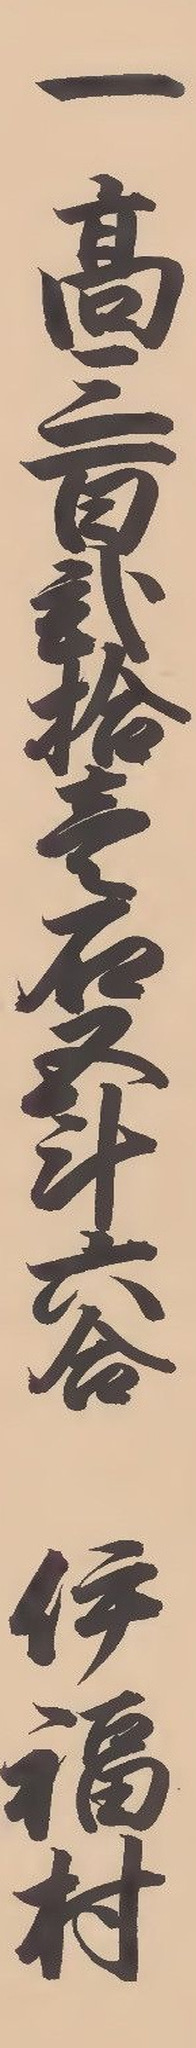一高三百弐拾壱石五斗六合伊福村
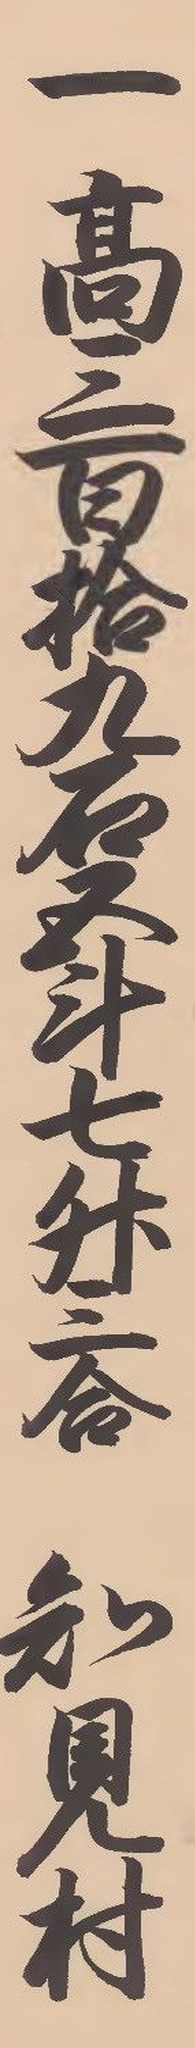一高三百拾九石五斗七升三合知見村
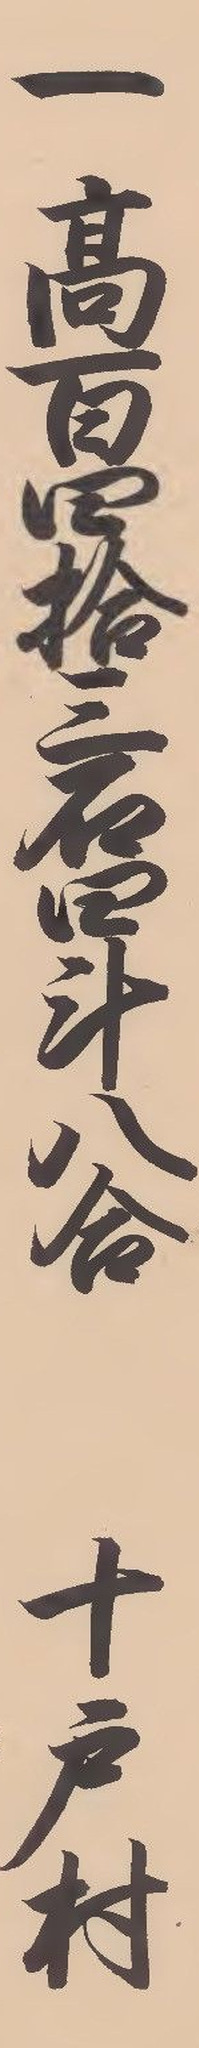一高百四拾三石四斗八合十戸村
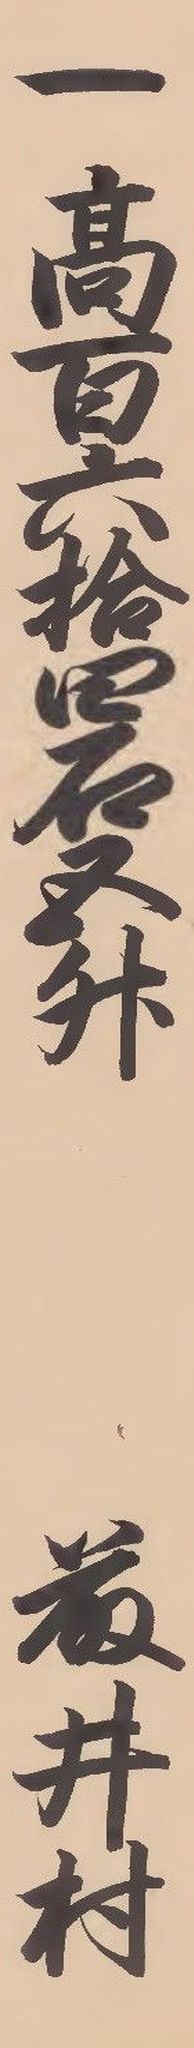一高百六拾四石五升藤井村
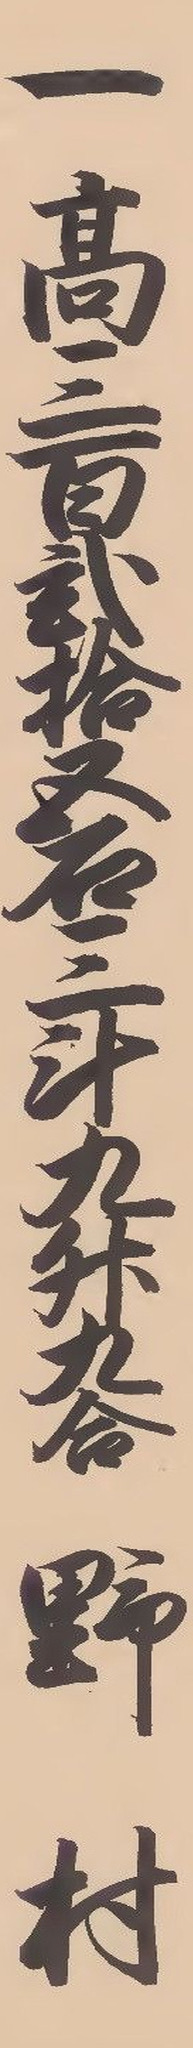一高三百弐拾五石三斗九升九合野村

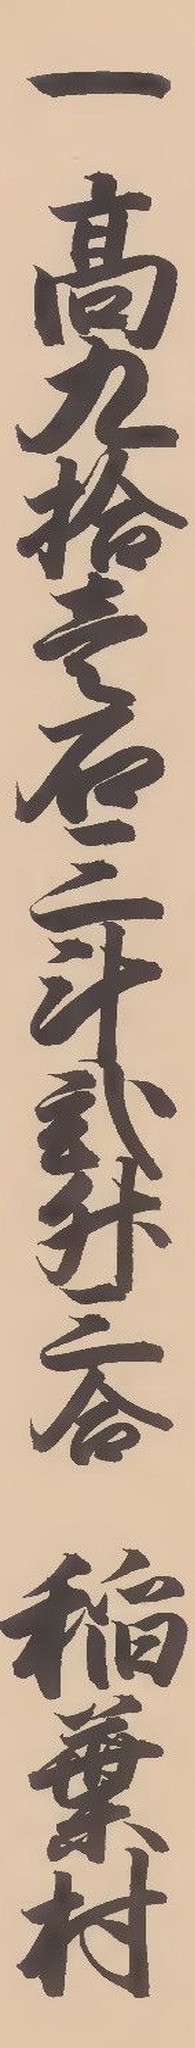一高九拾壱石三斗弐升三合稲葉村
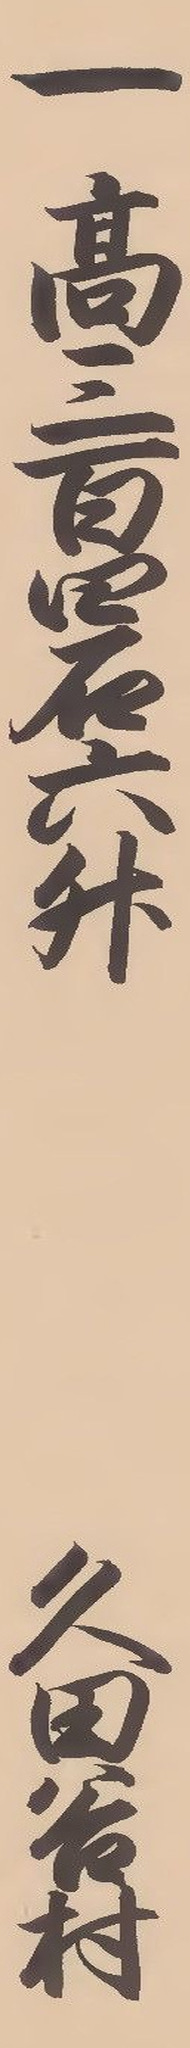一高三百四石六升久田谷村
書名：但馬国郷帳
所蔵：国立公文書館 National Archives of Japan
